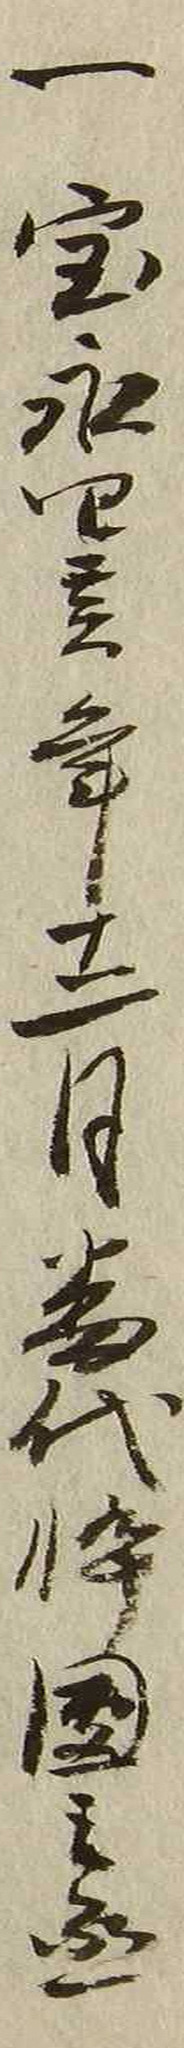一宝永四亥年十二月番代忰国之丞
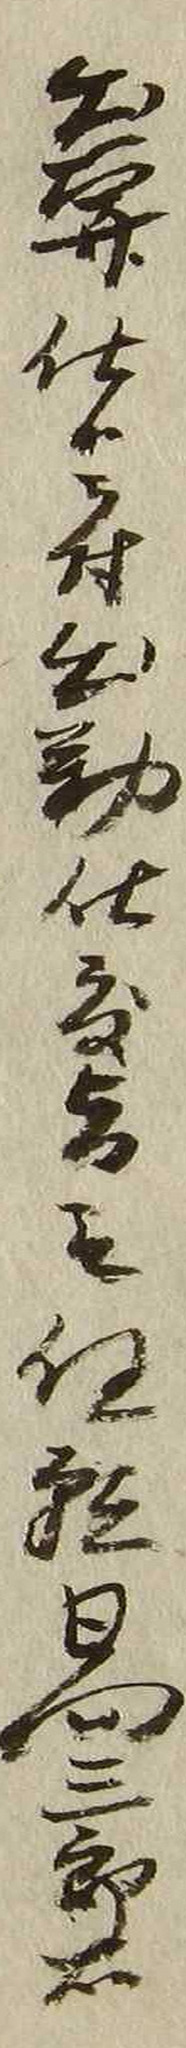出奔仕候ニ付出勤仕度旨被任願日向三郎右
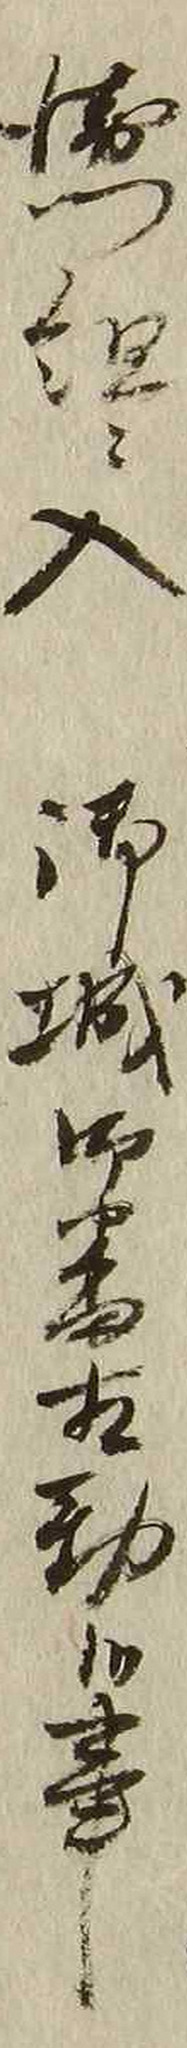衛門組ニ入御城御番相勤候事
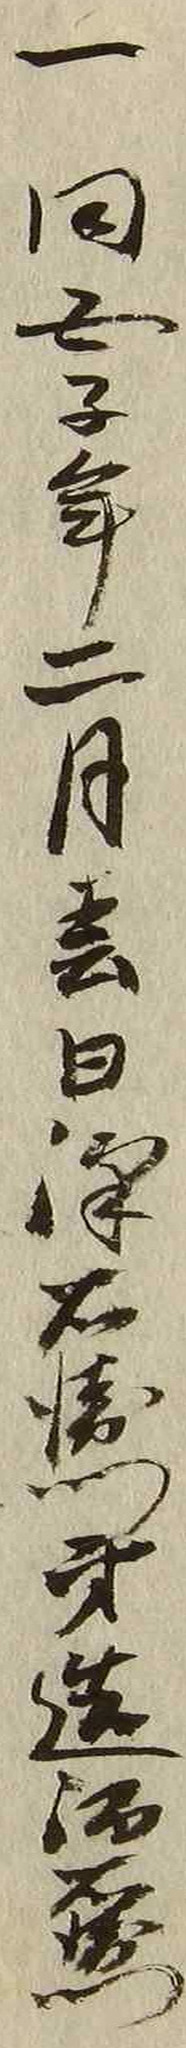一同五子年二月春日沢右衛門弟造酒右衛門
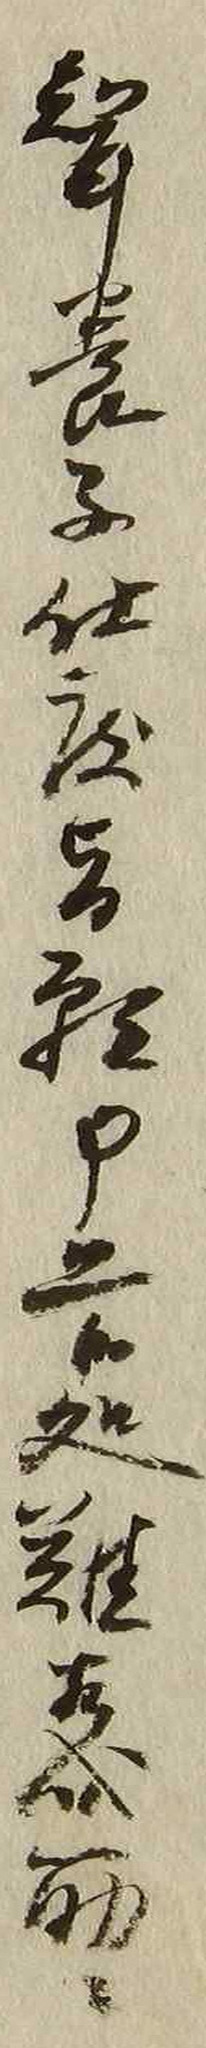智養子仕度旨願申上候処難相成筋ニ
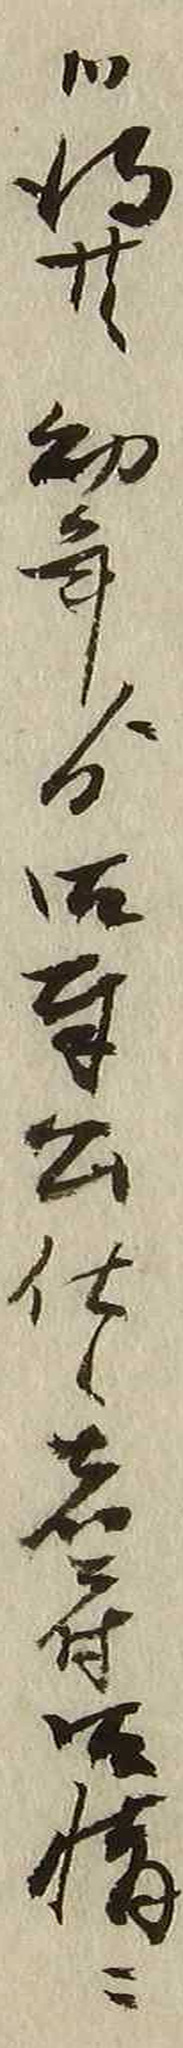候得共幼年ゟ御奉公仕候者ニ付御情ニ
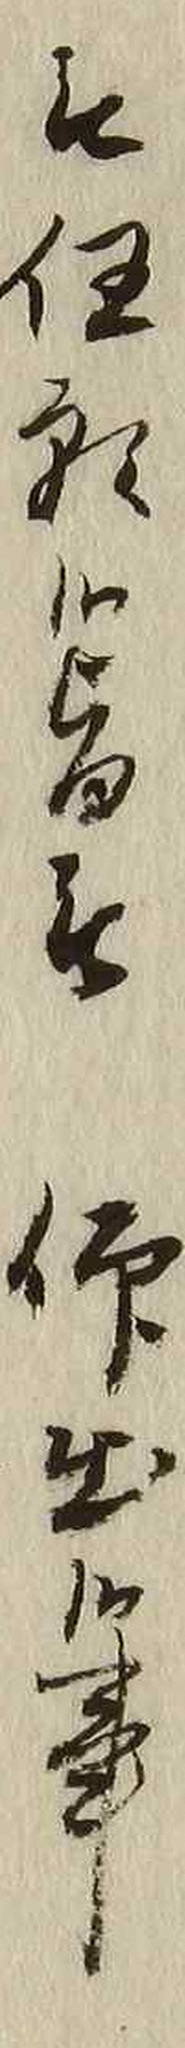被任願候旨被仰出候事
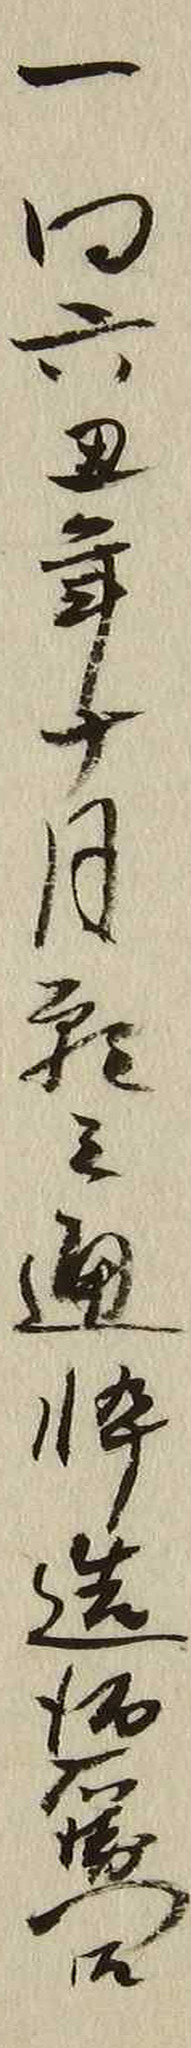一同六丑年十月願之通忰造酒右衛門御
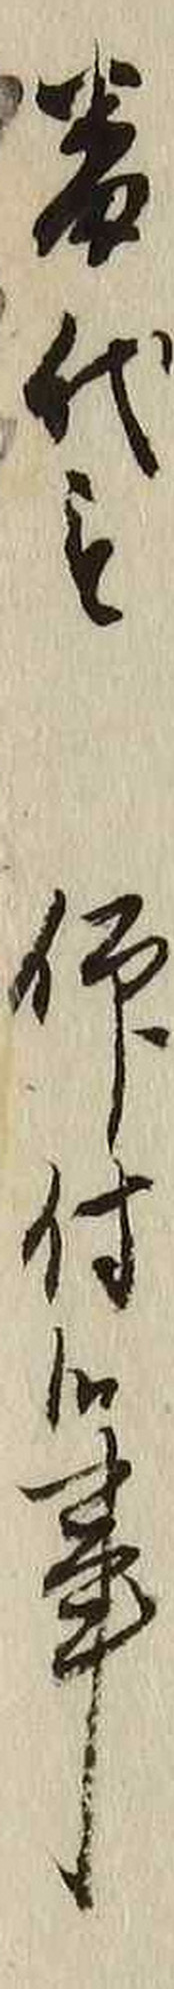番代被仰付候事
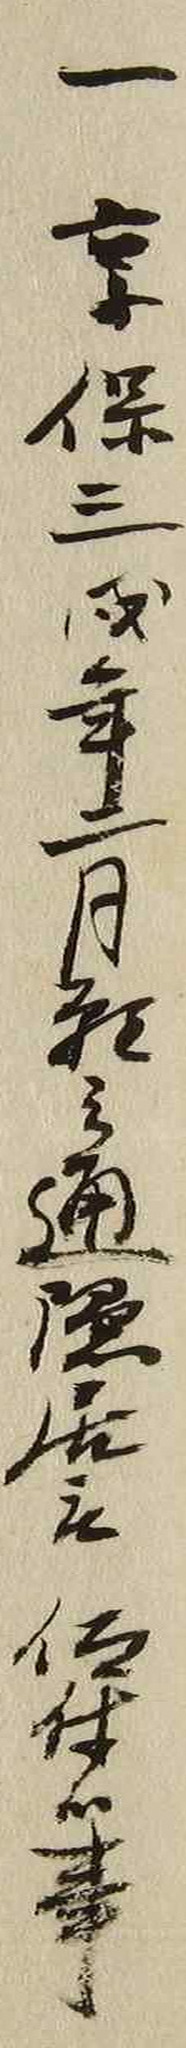一享保三戌年二月願之通隠居被仰付候事
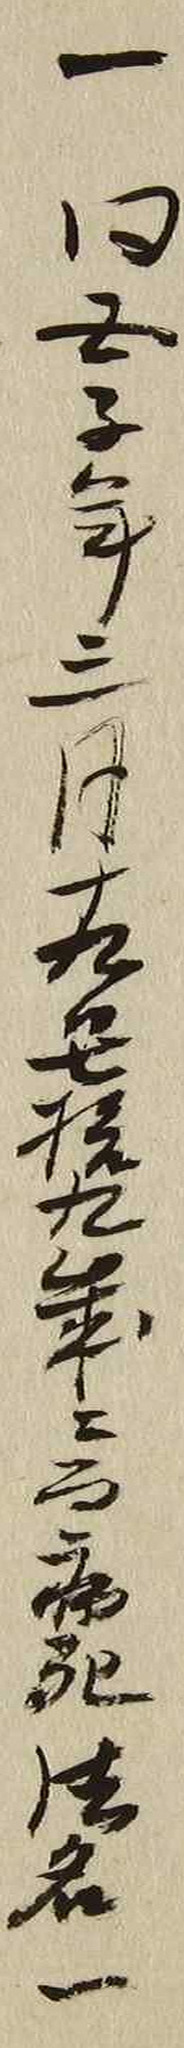一同五子年三月十九日七拾九歳ニ而病死法名一
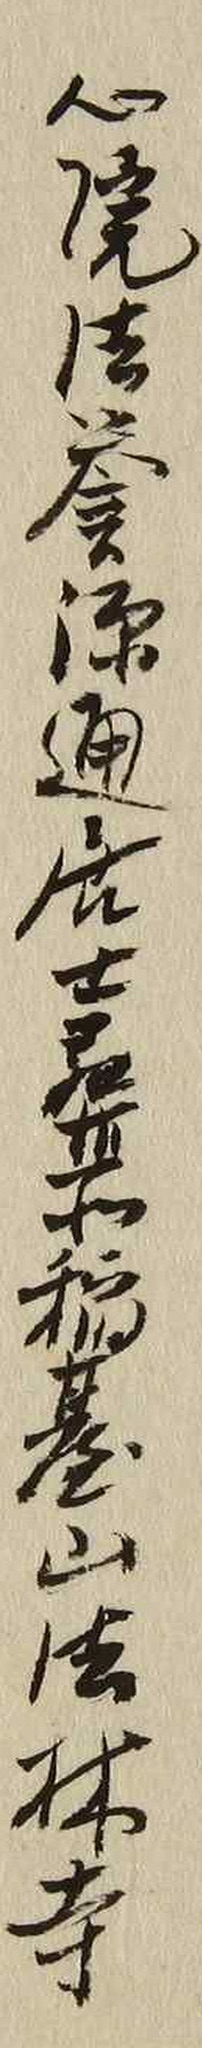心院法誉源通居士葬所稲台山法林寺
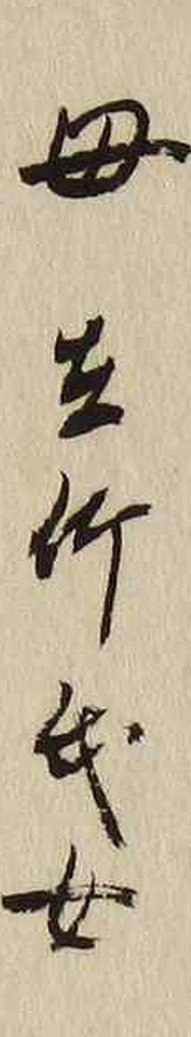母在竹氏女
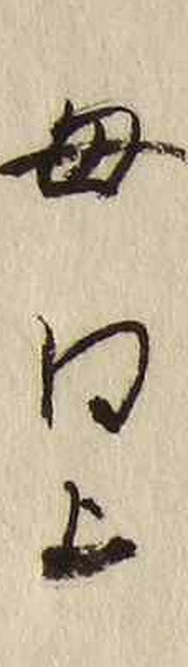母同上

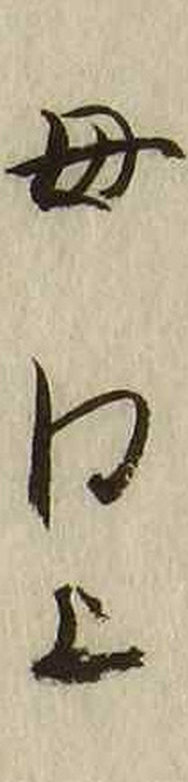母同上
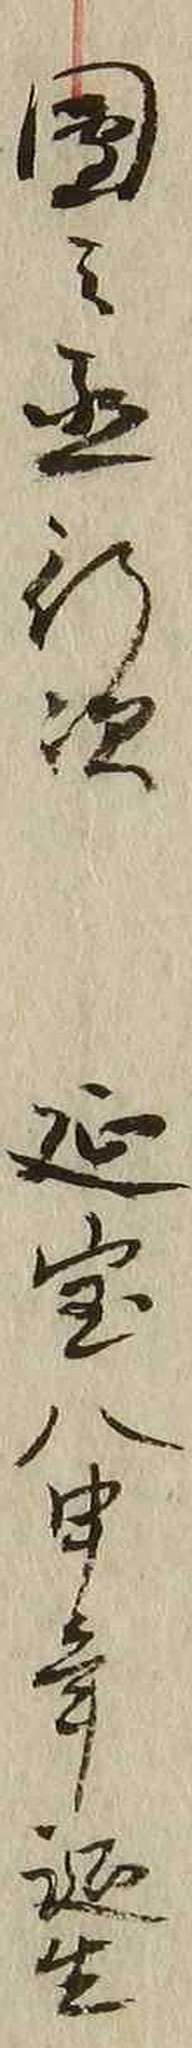団之丞行次延宝八申年誕生
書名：諸士系譜　巻之345　も之部1
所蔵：会津若松市立会津図書館
